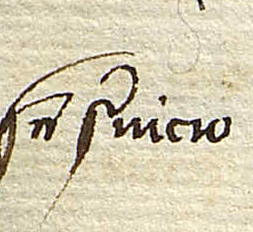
ſn* ſ*uicio
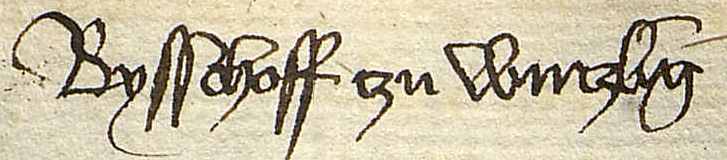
Byſchoff cʒu Wircʒb*g
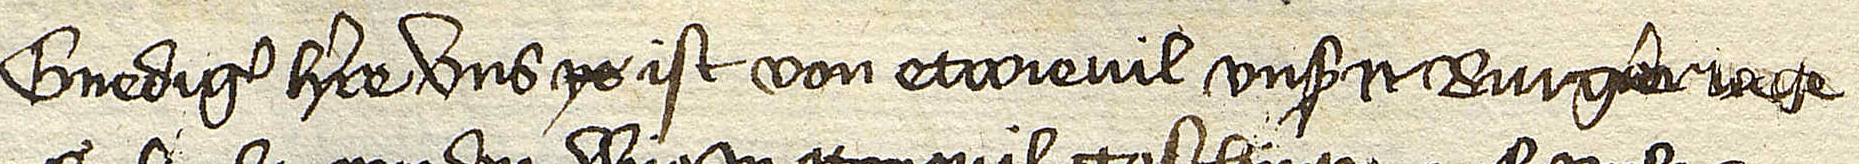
Gnedig* h*re Vns ye iſt von etwieuil vnſ*n Burgn* wege
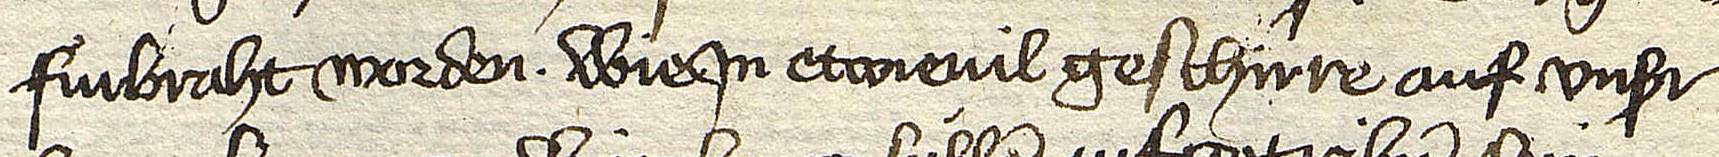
fürbraht worden . Wie In etwieuil geſchirre auf vnſ*r
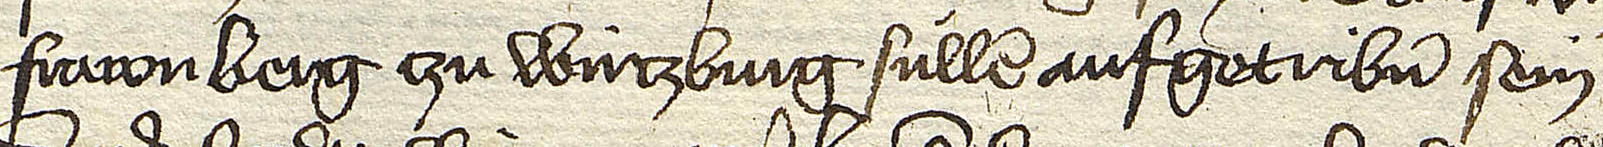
frawnberg cʒu Wircʒburg ſülle* aufgetrib*n ſein
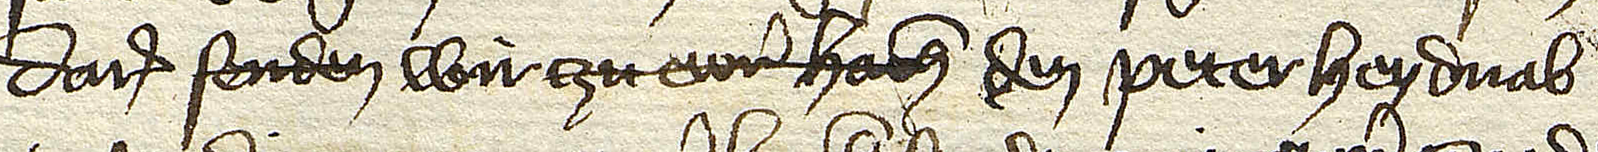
Dar* ſenden wir cʒu ew*r hoch* den Peter heydnab
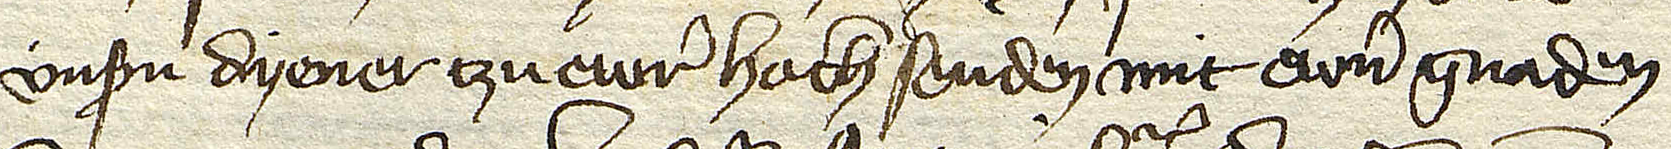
vnſ*n dyener cʒu ew*r hoch* ſenden mit ew*n gnaden
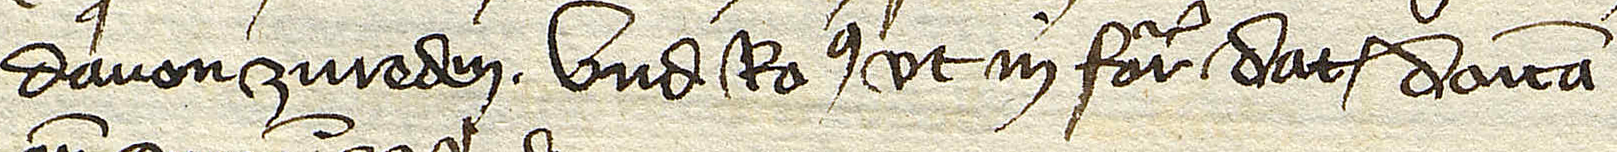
dauon cʒureden . Vnd Ro* vt in for* / dat* doica*
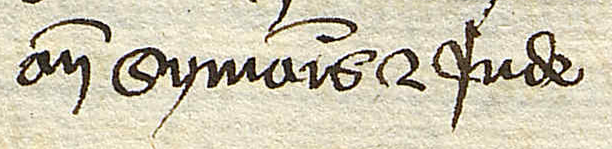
an* Symo*is @ Iude
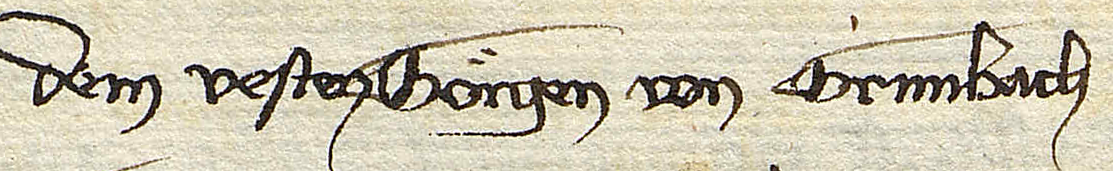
Dem veſten Görgen von Grunbach
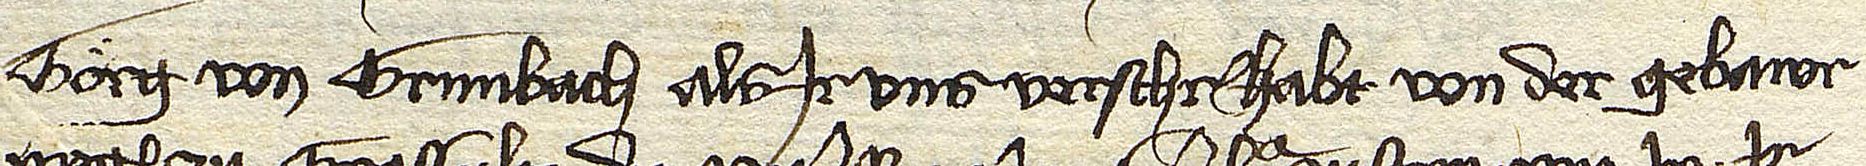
Görg von Grunbach als Ir vns verſchr* habt von der gebawr
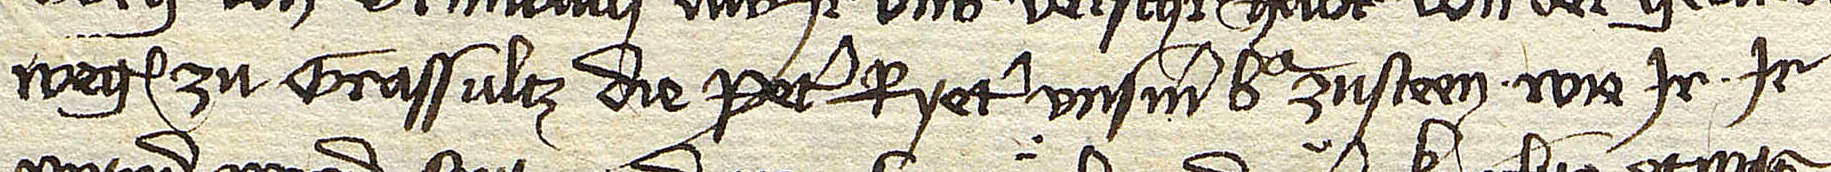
weg* ʒu Graſſulcʒ die Pet* R*yet vnſ*m b* ʒuſteen . wie Ir . Ir
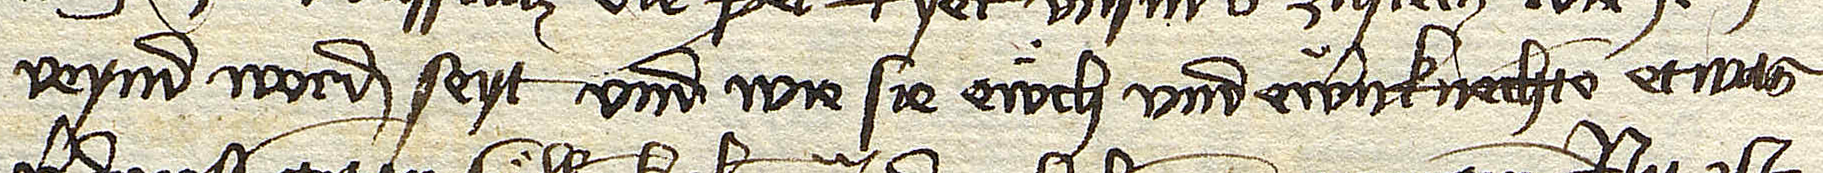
veynd word* ſeyt nvd wie ſie ewch vnd ew*n knechte* etwas
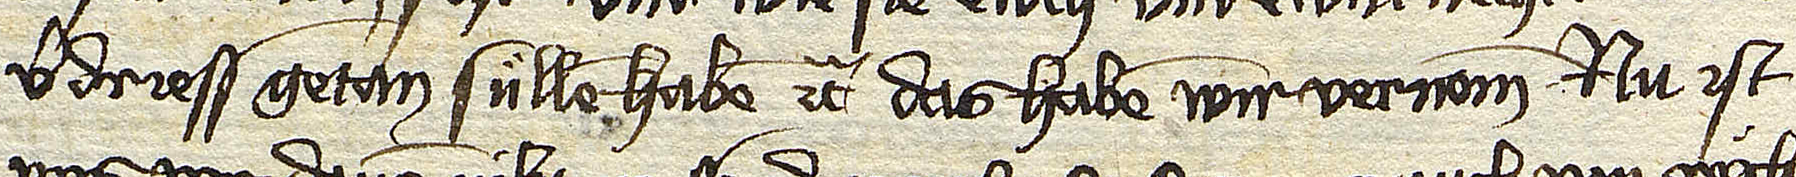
v*drieſſ getan ſülle habe* ec* das habe* wir vernom* . Nu iſt
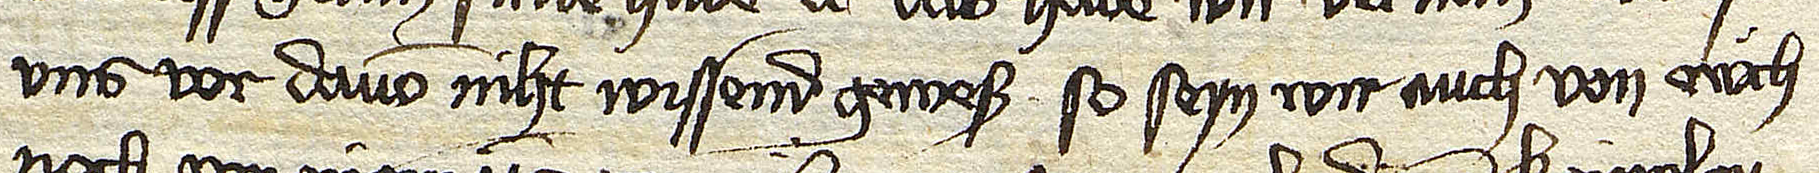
vns vor dauo* niht wiſſend geweſ* . ſo ſeyn wir auch von ewch
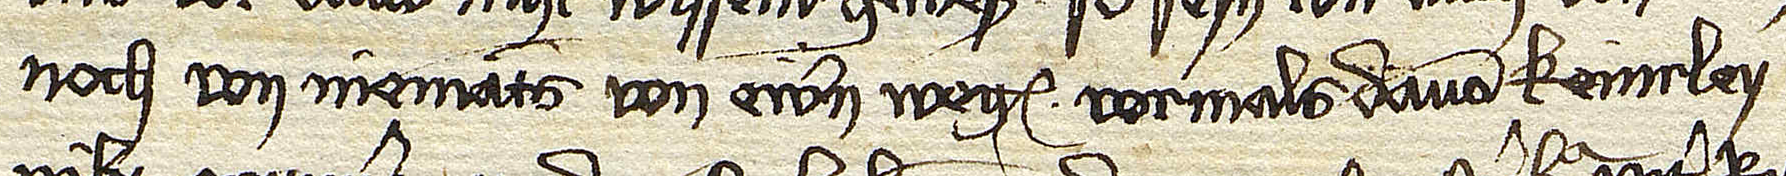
noch von niema*ts von ew*n weg* . vormals dauo* keinrley
